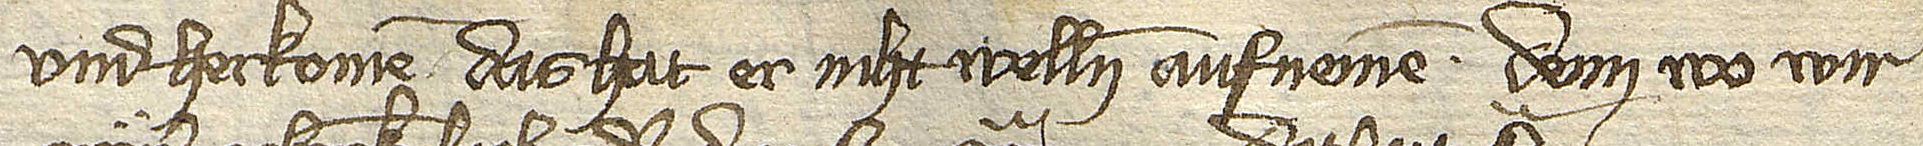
vnd herkome* / das hat er niht welln* aufneme* . Denn wo wir
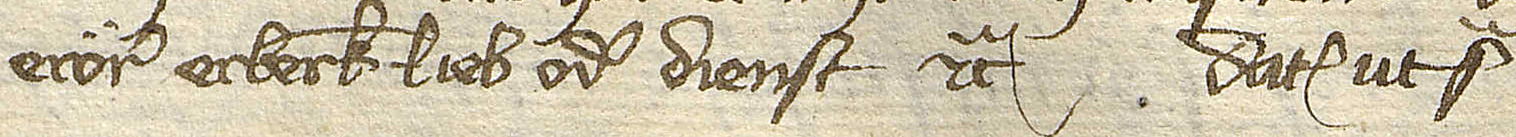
eẅr* erberk* lieb od* dienſt ec* Dat* ut ſ*
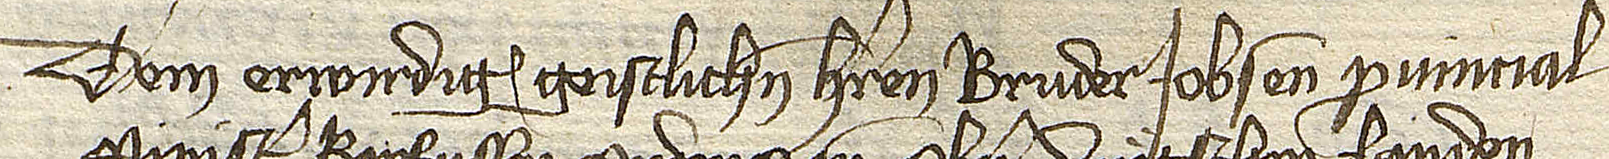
Dem erwirdig* geiſtlichn* h*ren Bruder Iobſen p*unicial
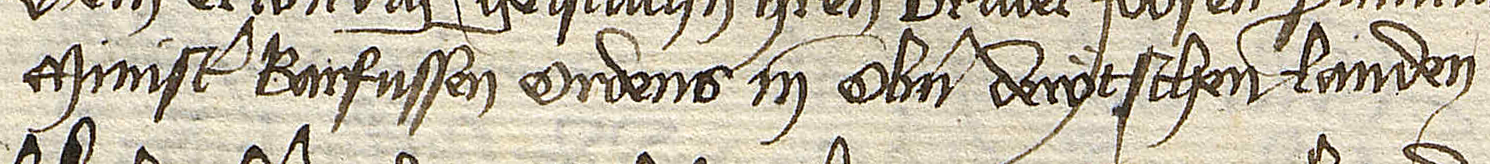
Miniſt* Barfuſſen Ordens in Obn* Deẅtſchen landen
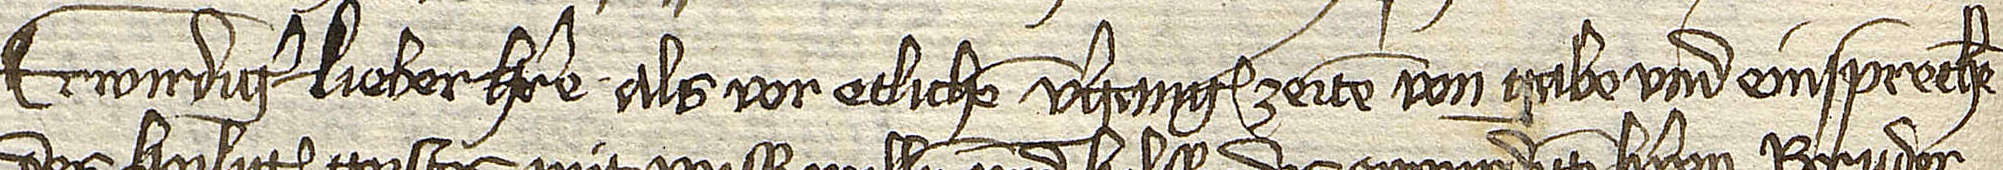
Erwirdig* lieber h*re . als vor etliche* v*gang* ʒeite* von gabe vnd einſpreche*
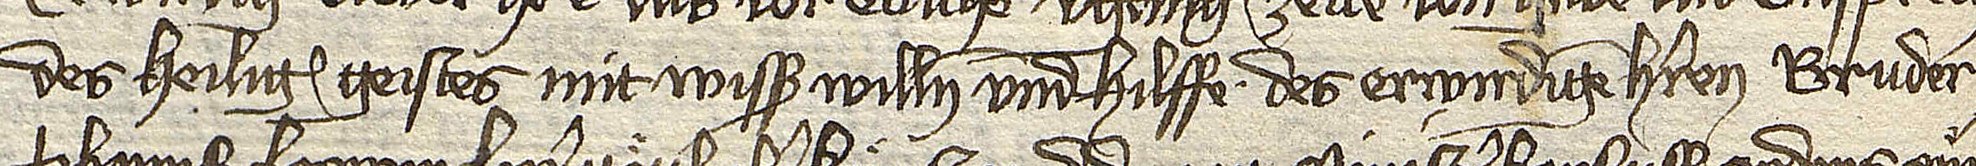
des heilig* geiſtes mit wiſſ* willn* vnd hilffe . des erwirdige* h*ren Bruder
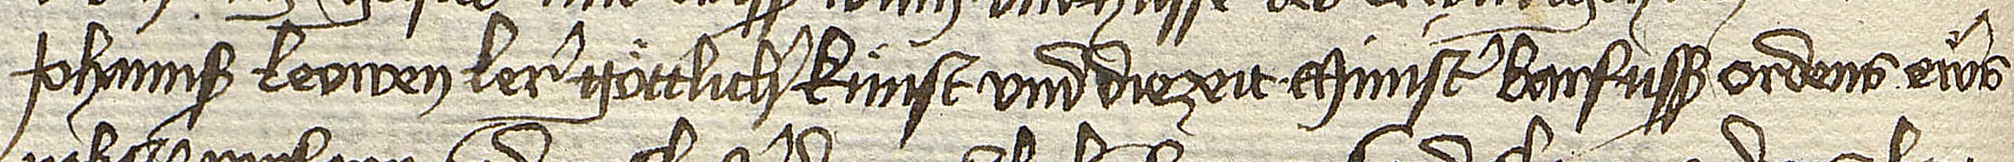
Iohannſ* levwen ler* göttlich* künſt vnd die ʒeit Miniſt* barfuſſ* ordens eẅ*s
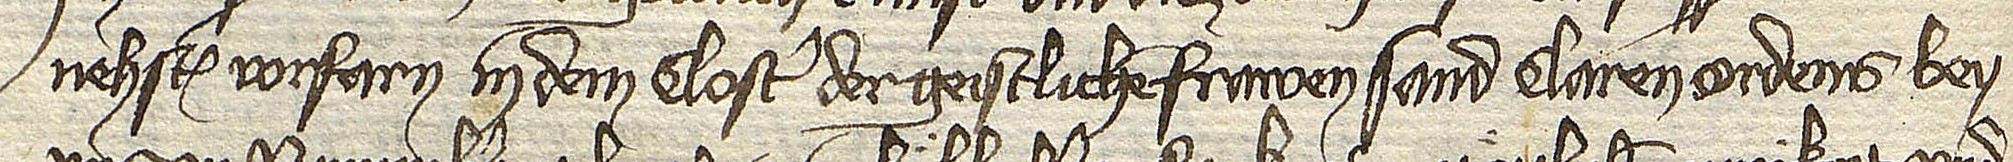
nehſt* vorfarn in dem Cloſt* der geiſtliche* frawen ſand Claren Ordens bey
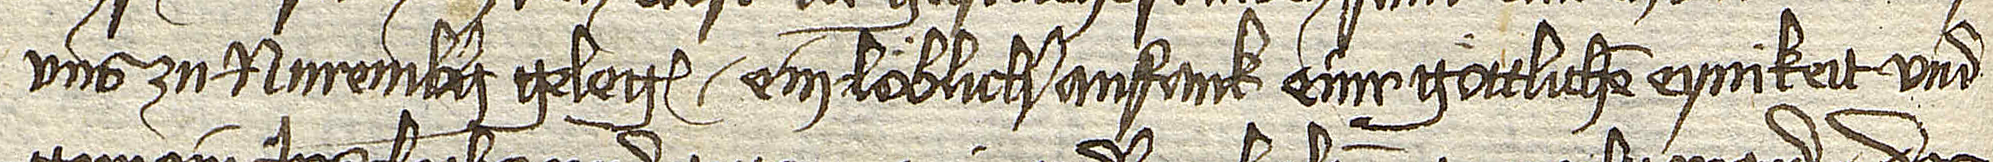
vns ʒu Nuremb*g geleg* / ein löblich* anfank einr göttliche* eynikeit vnd
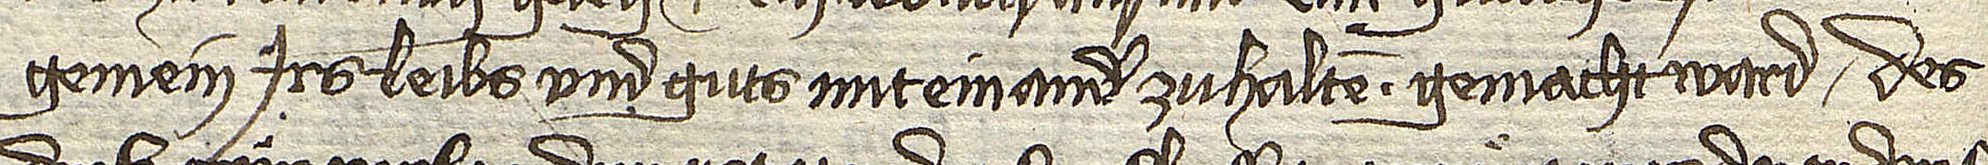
gemein Irs leibs vnd guts miteinand* ʒuhalte* . gemacht ward / Des
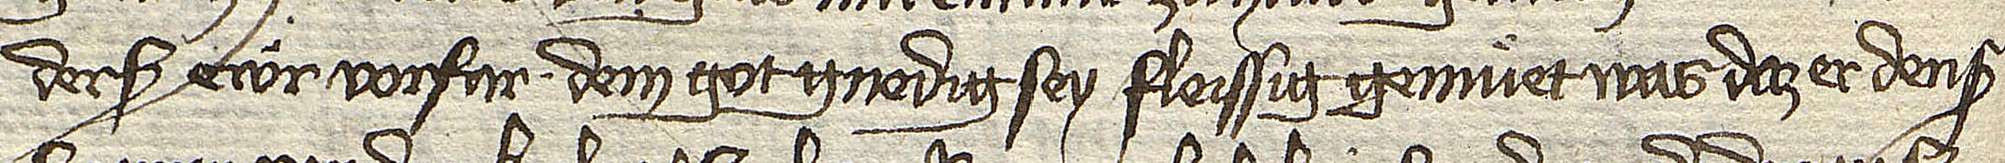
derſ* eẅr vorfar . dem got gnedig ſey fleiſſig gemüet was daʒ er denſ*
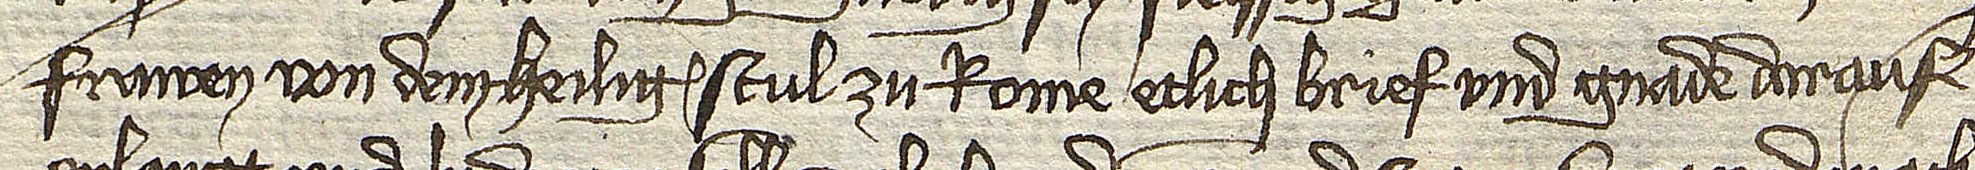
frawen von dem heilig* ſtul ʒu Rome etlich brief vnd gnade darauf
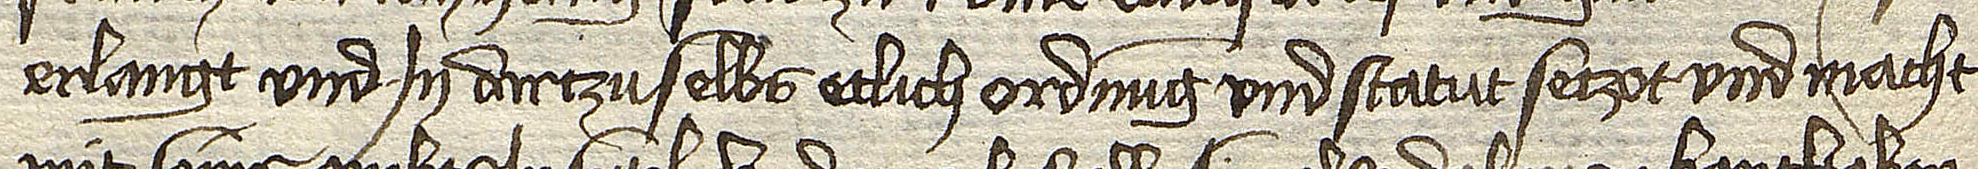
erlangt vnd In darcʒuſelbs etlich ordnu*g vnd ſtatut ſecʒet vnd macht
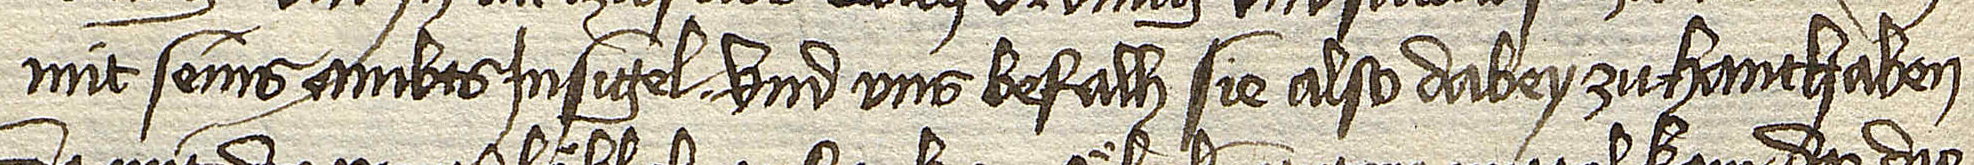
mit ſeins ambts Inſigel . Vnd vns befalh ſie alſo dabey ʒu hanthaben
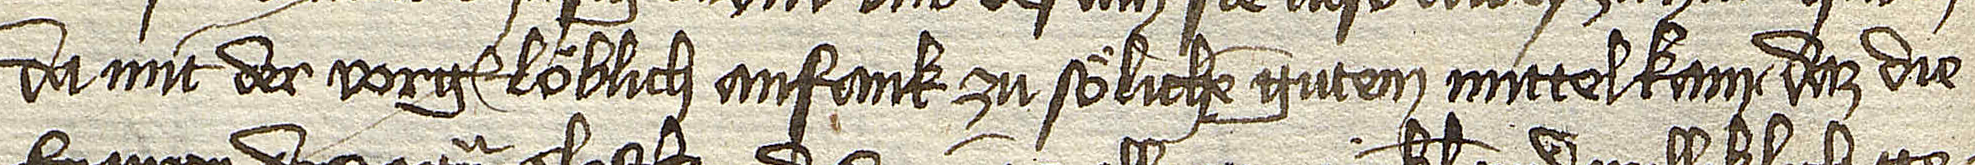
Da mit der vorg* löblich anfank ʒu ſöliche* guten mittel kam / daʒ die
